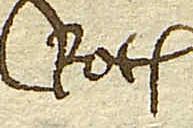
Rot*
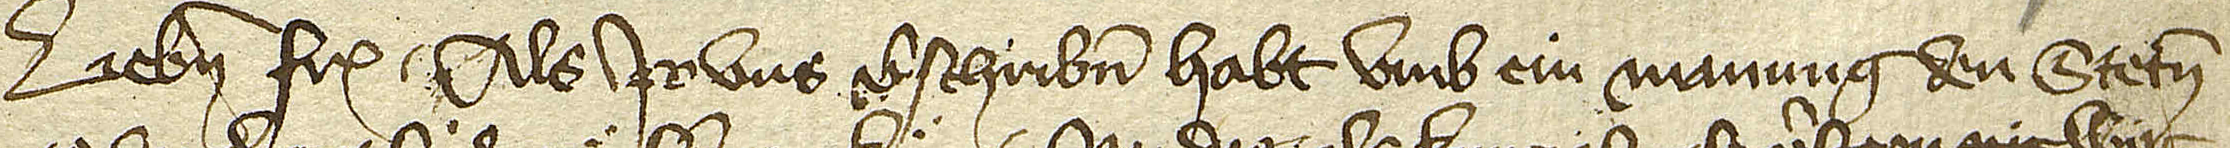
Liebn* fr* / Als Ir vns v*ſchribn* habt vmb ein manung den Stetn*
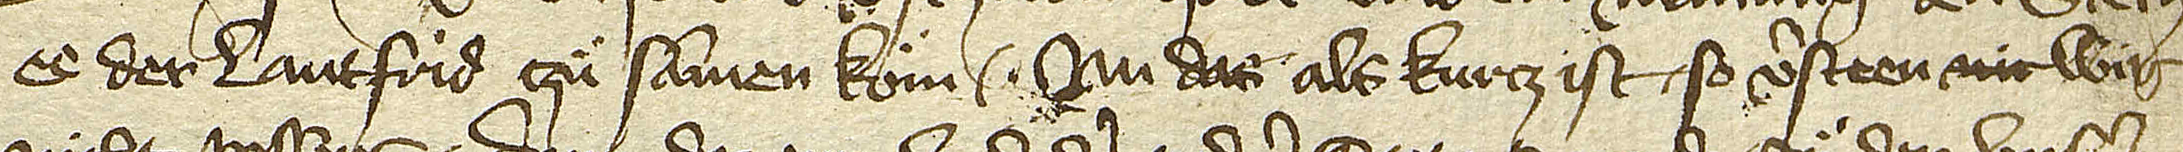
ee der lantfrid cʒü ſa*men köm / . Nu das als kurcʒ iſt / ſo v*ſteen nu wir
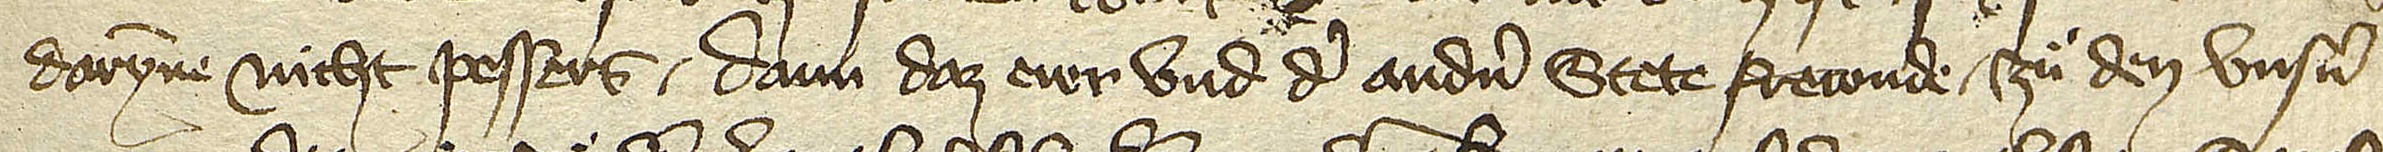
daryne* nicht peſſers / dann daʒ ewr vnd d* andn* Stete frewnde / cʒü den vnſn*
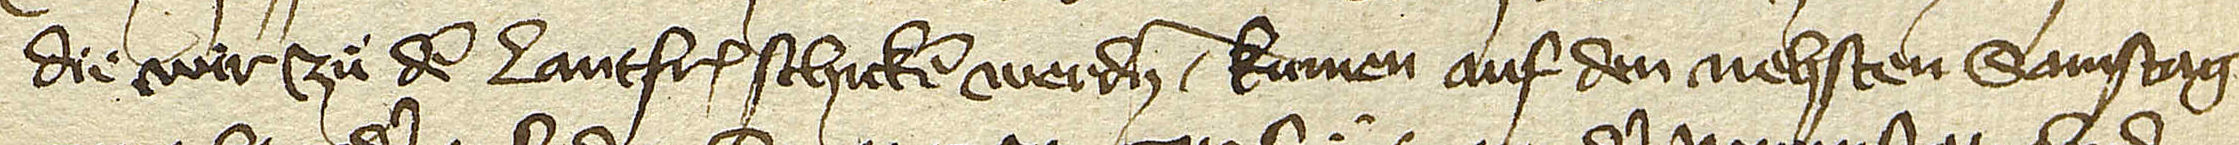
die wir cʒü d* lantfr* ſchicke* werde* / kumen auf den nehſten Samſtag
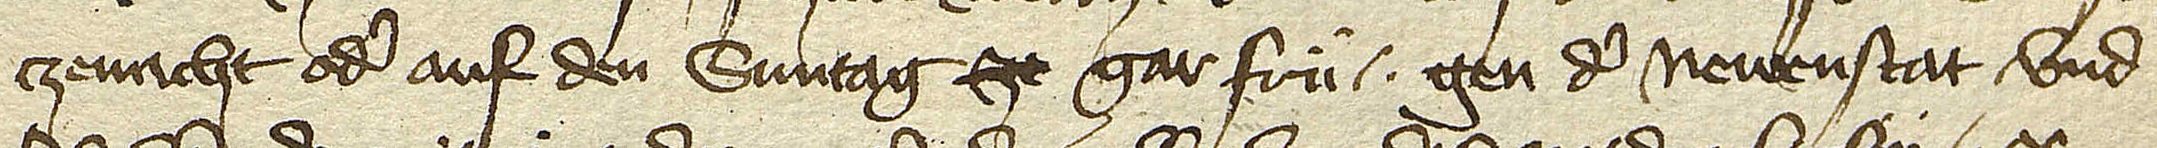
cʒenacht od* auf den Suntag cʒe gar frü / . gen d* Newenſtat / vnd
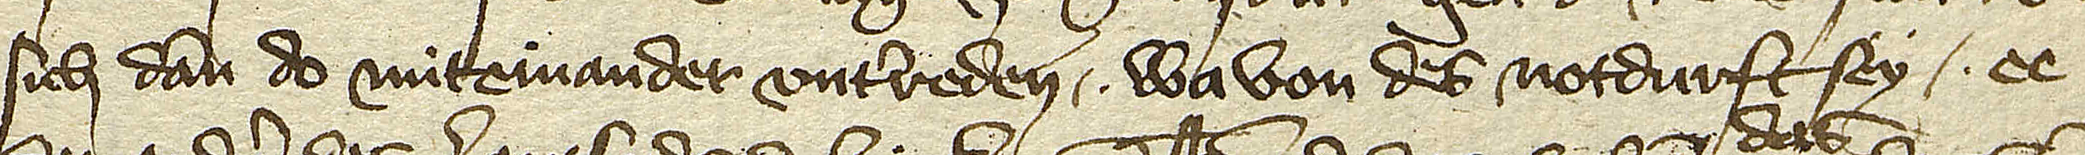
ſich dan* do miteinander vnt*reden / . wa von des notdurft ſey / . ee
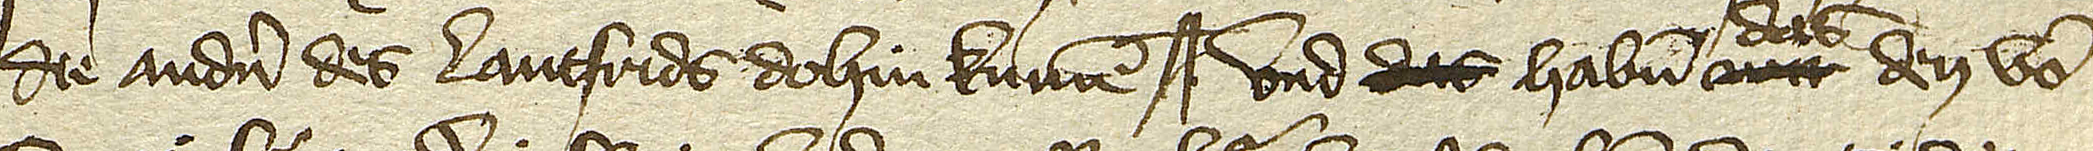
die andn* des lantfrids* dohin kume* / . Vnd das habn* wir den vo*
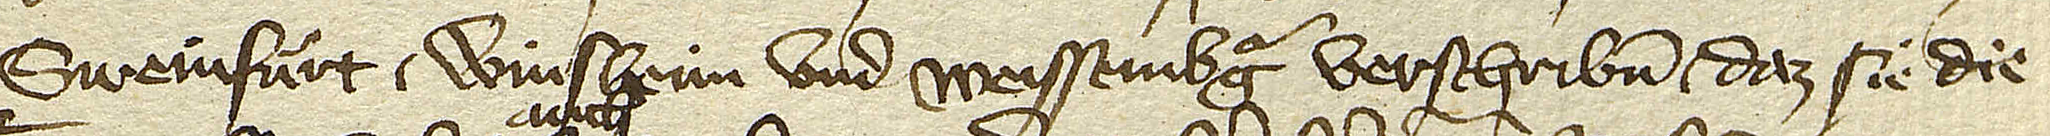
Sweinfurt / winſheim vnd weiſſembg* verſchribn* / daʒ ſie die
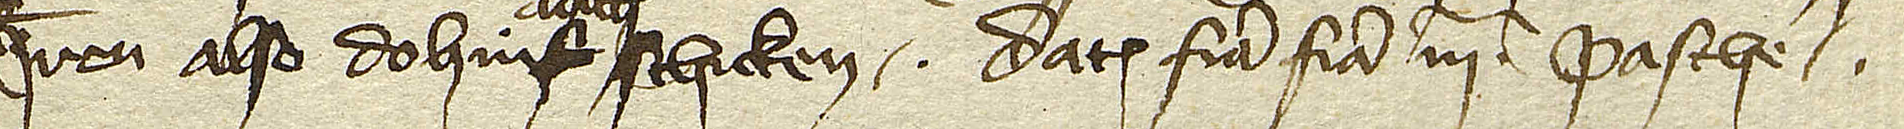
Iren alſo dohinſ ſchicken / . Dat* fia* fia* iii* . Paſche / .
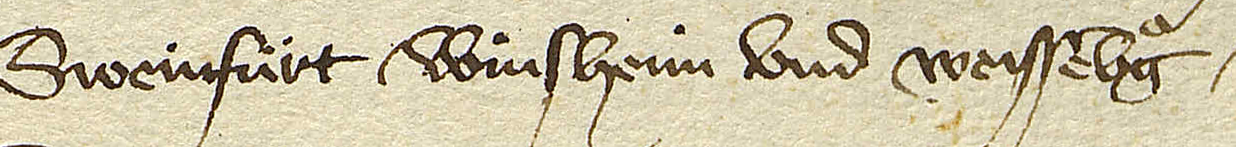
Sweinfürt / winſheim vnd weiſſe*bg* /
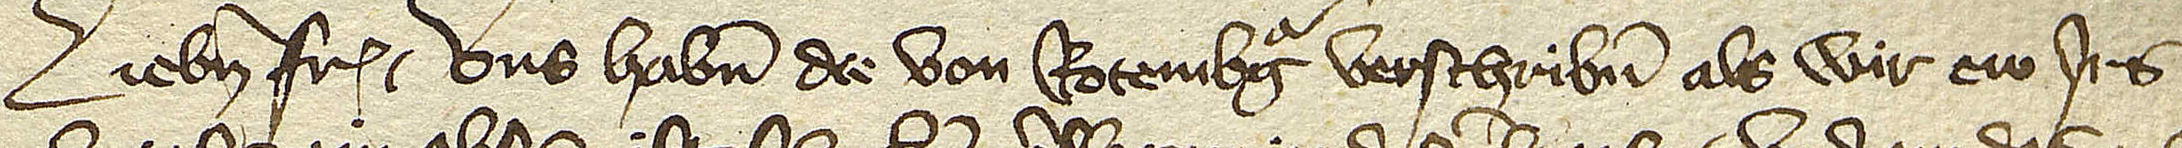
Liebn* fr* / Vns habn* die von Rotembg* verſchribn* als wir ew Ires
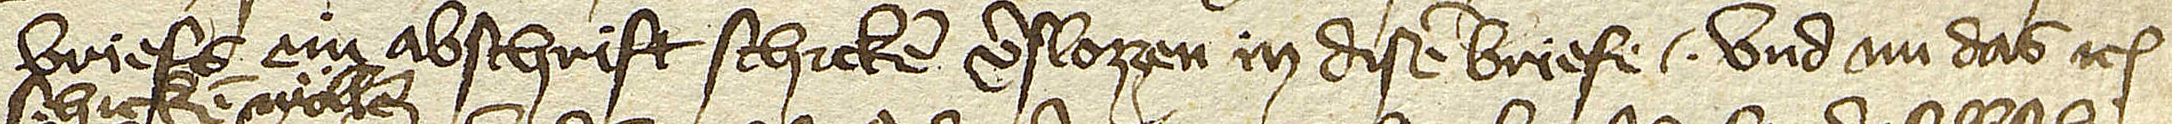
briefs ein abſchrift ſchicke* v*ſloʒʒen in diſe* briefe / . vnd nu das ec*
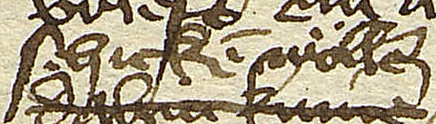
ſchicke* wölle*
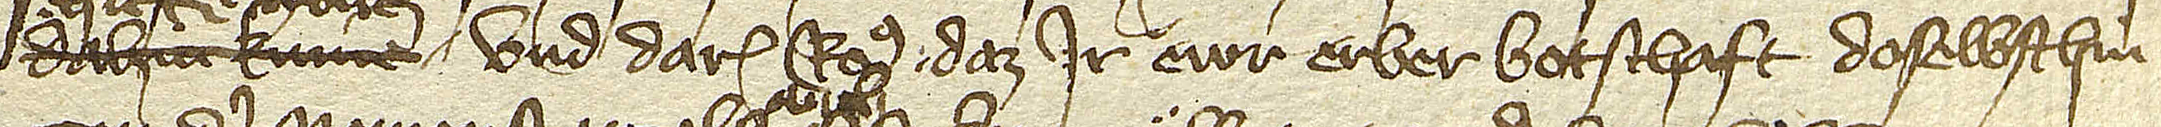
dahin kume* / vnd dar* Ro* / daʒ Ir ewr erber botſchaft doſelbſt hin
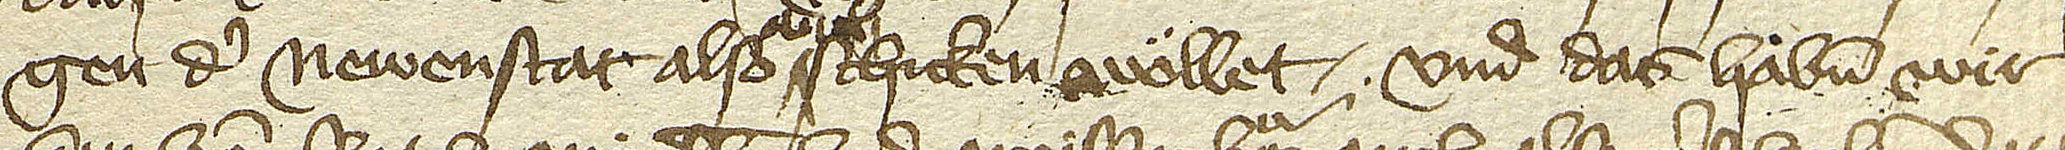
gen d* Newenſtat alſo ſchicken wöllet / . vnd das habn* wir
